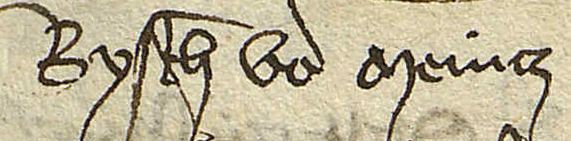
Byſch* vo* Meincʒ
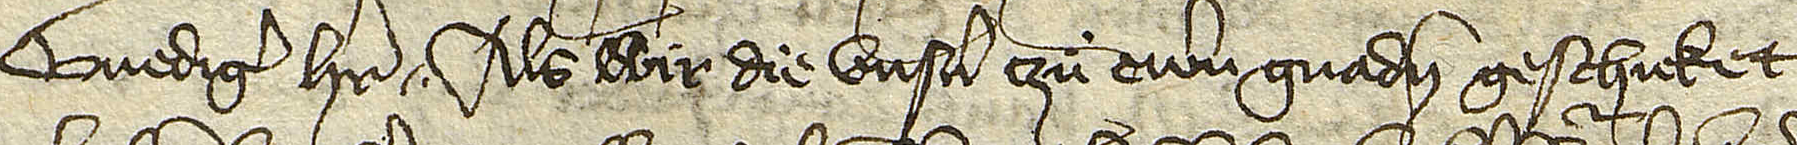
Gnedig* hr* / . Als wir die vnſn* cʒü ew*n gnadn* geſchicket
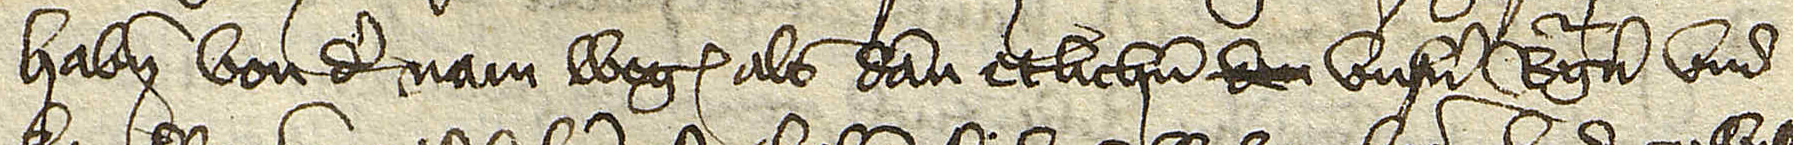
habn* von d* nam weg* als dan* etlichn* den vnſn* B*gn* vnd
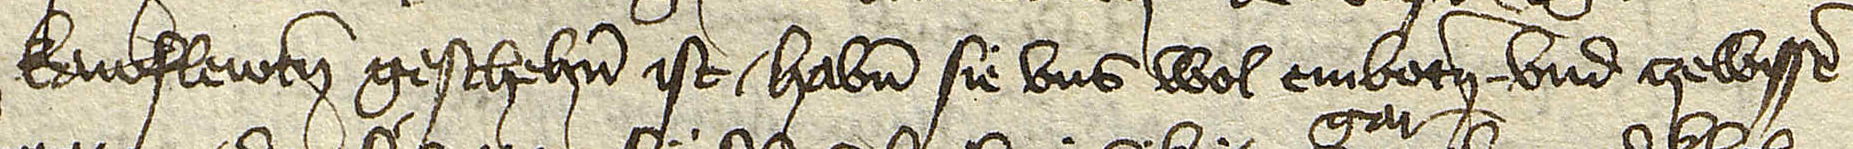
kawflewtn* geſchehn* iſt / habn* ſie vns wol embotn* vnd cʒewiſſe*
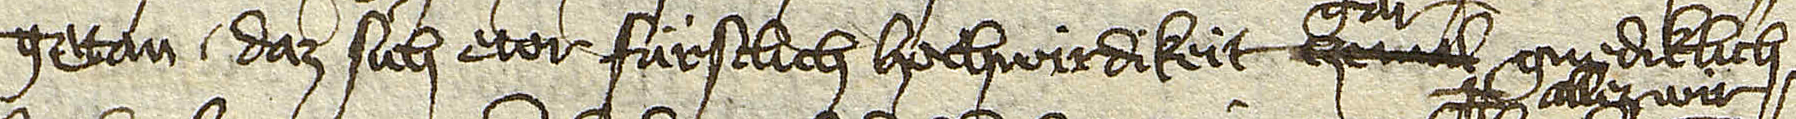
getan / daʒ ſich ewr fürſtlich hochwirdikeit cʒemal gnediklich
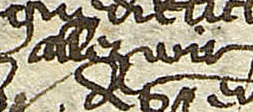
aller wir
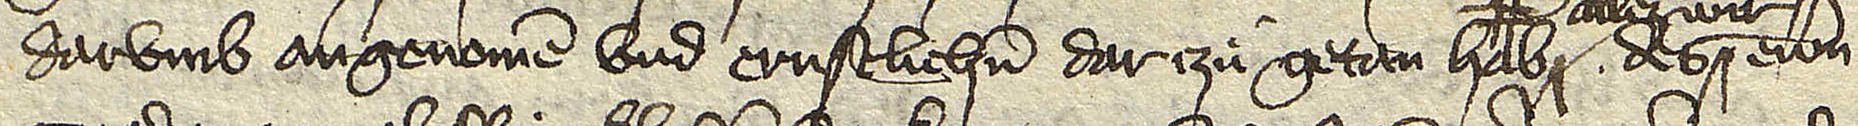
darvmb angenome* vnd ernſtlichn* dar cʒü getan hab / . des ew*n
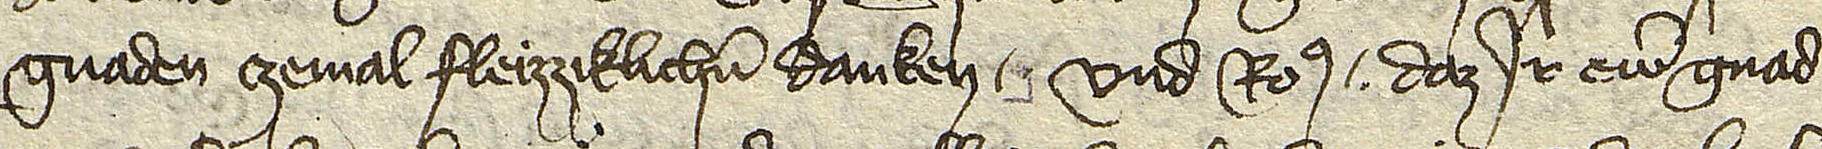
gnaden cʒemal fleiʒʒiklichn* danken / vnd Ro* / . daʒ Ir ew* gnad
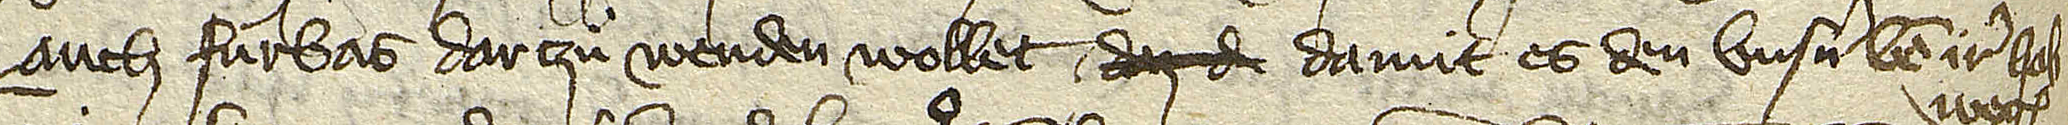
auch fürbas darcʒü wenden wollet / daʒ d damit es den vnſn* vo* ir* hab
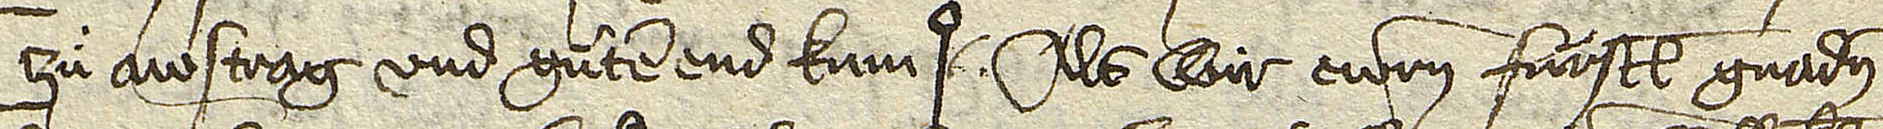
cʒü awſtrag vnd güte* end kam / . Als wir ewrn* fürſtl* gnadn*
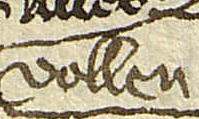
vollen
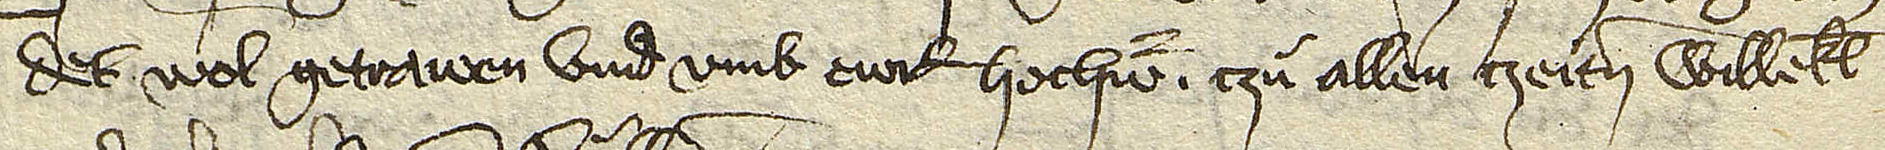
des wol getrawen vnd vmb ewr* hochw* . cʒu allen cʒeitn* willekl*
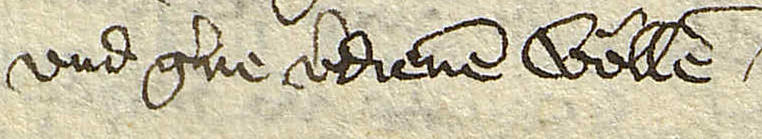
vnd g*ne v*diene* wölle* /
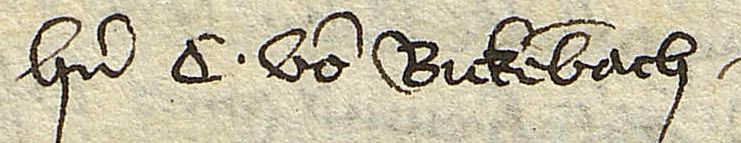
hn* C . vo* Bicke*bach /
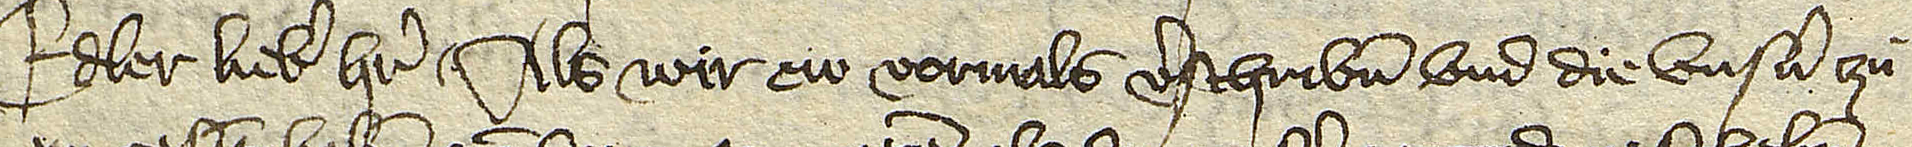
Edler lieb* hr* / . Als wir ew vormals v*ſchribn* vnd die vnſn* cʒü
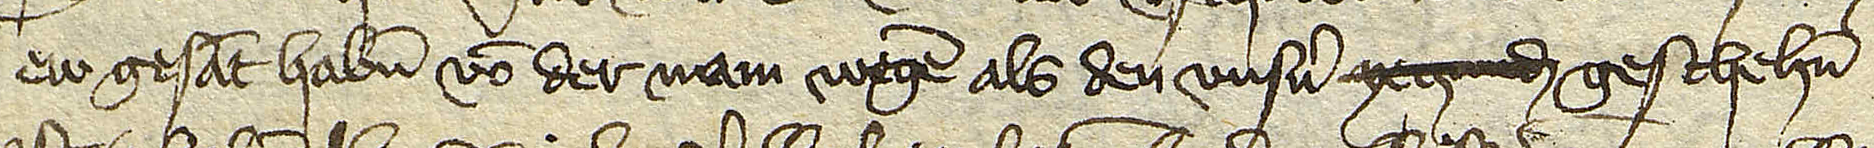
ew geſat* habn* vo* der nam wege* als den vnſn* yecʒund* geſchehn*
